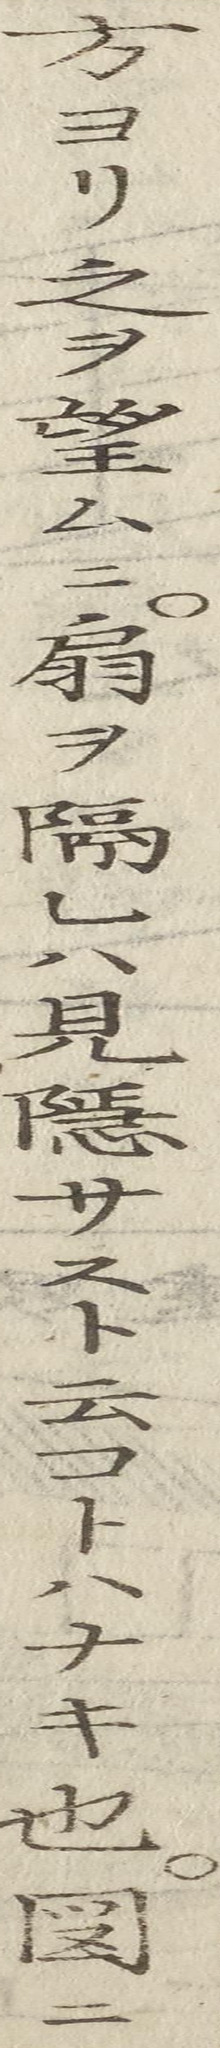方ヨリ之ヲ望ムニ。扇ヲ隔レハ見隠サスト云コトハナキ也。図ニ
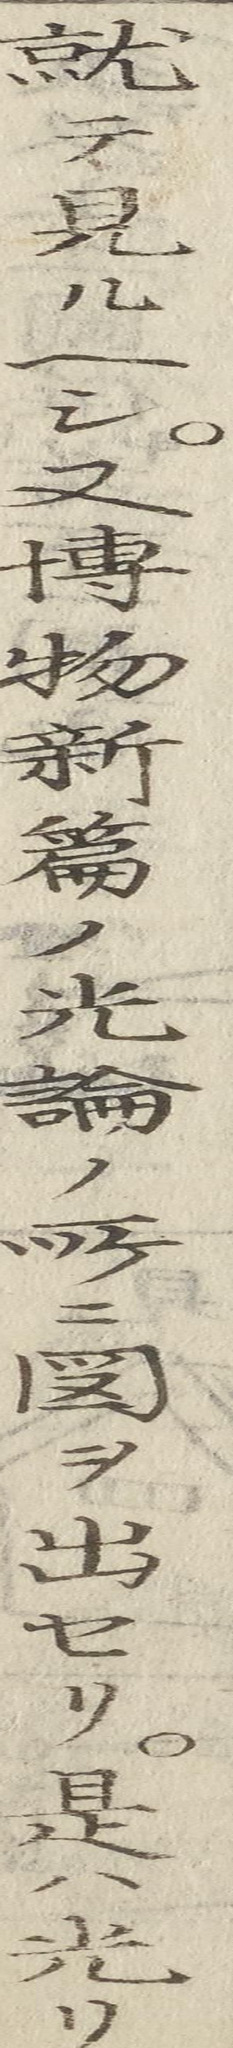就テ見ルヘシ。又博物新篇ノ光論ノ所ニ図ヲ出セリ。是ハ光

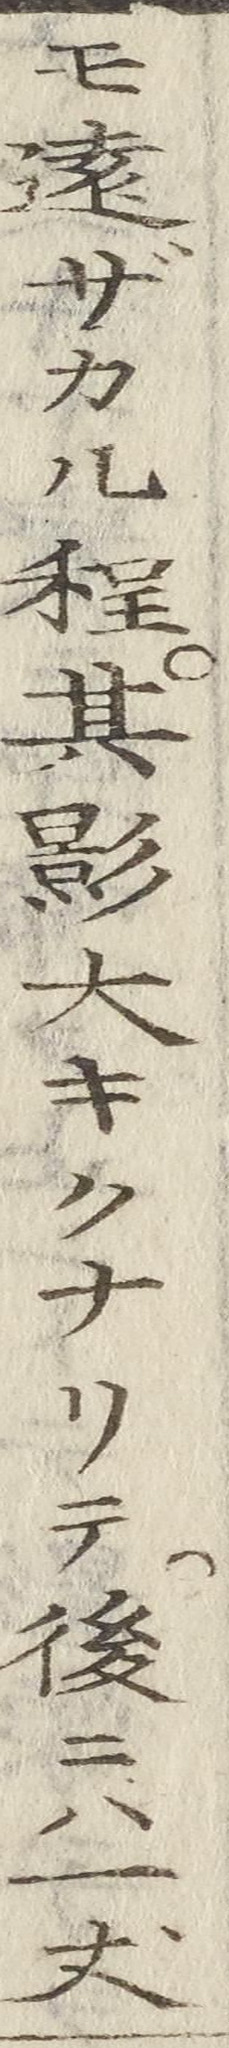モ遠サカル程。其影大キクナリテ。後ニハ一丈
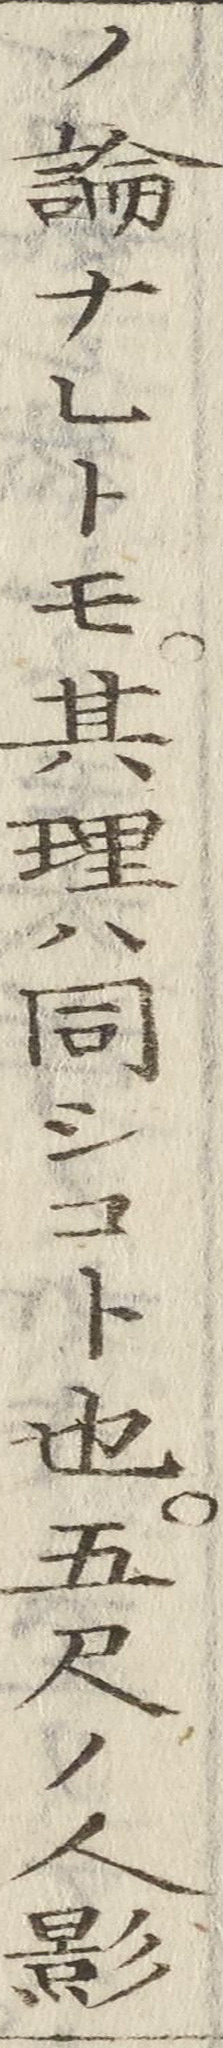ノ論ナレトモ。其理ハ同シコト也。五尺ノ人影
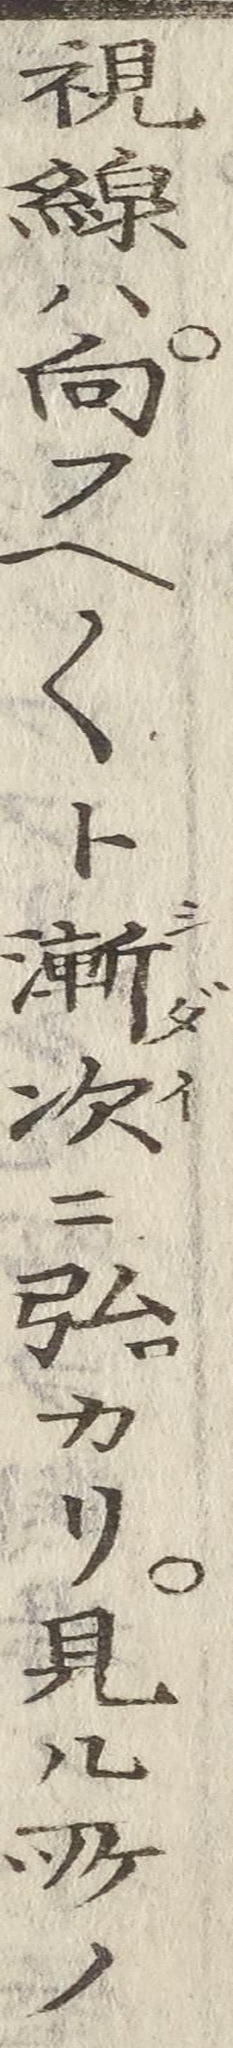視線ハ。向フヘ〳〵ト漸次ニ弘見ル所ノ
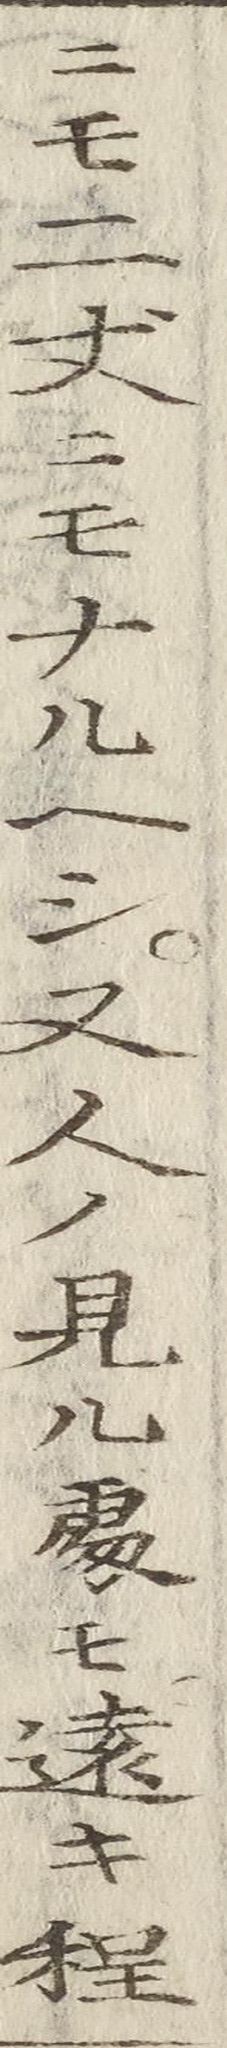ニモ二丈ニモナルヘシ。又人ノ見ル処モ遠キ程
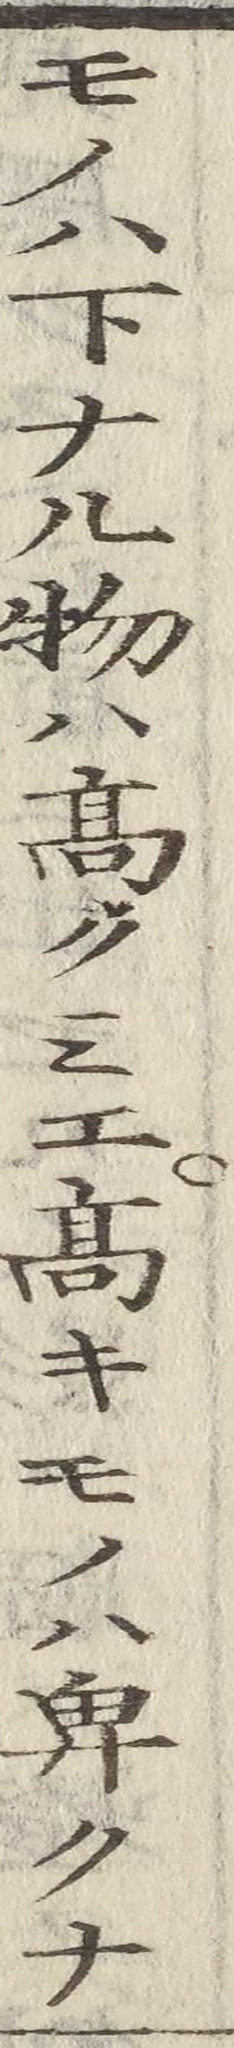モノハ下ナル物ハ高クミエ。髙キモノハ卑クナ
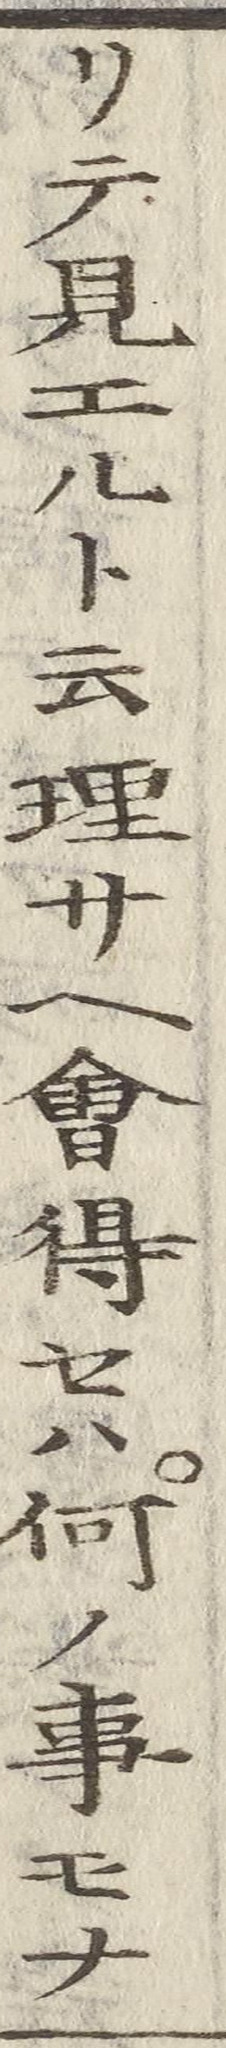リテ見エルト云理サヘ会得セハ。何ノ事モナ
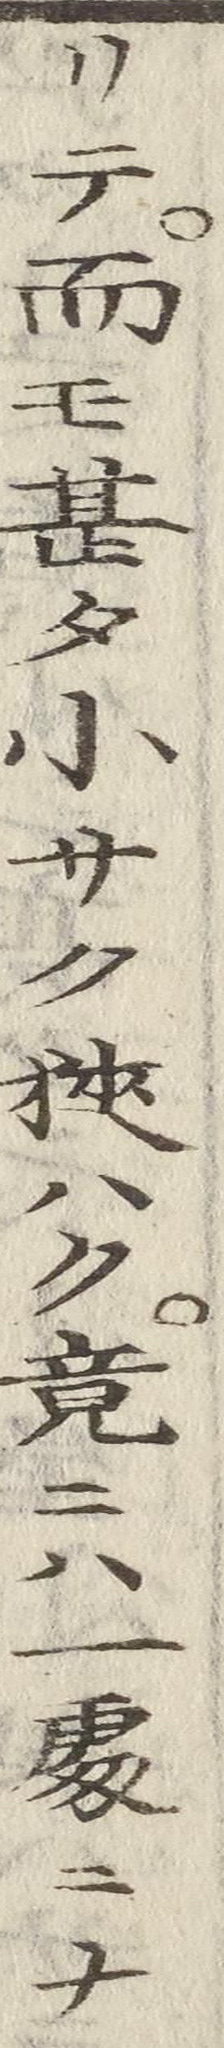リテ。而モ甚タ小サク狭ハク。竟ニハ一処ニナ
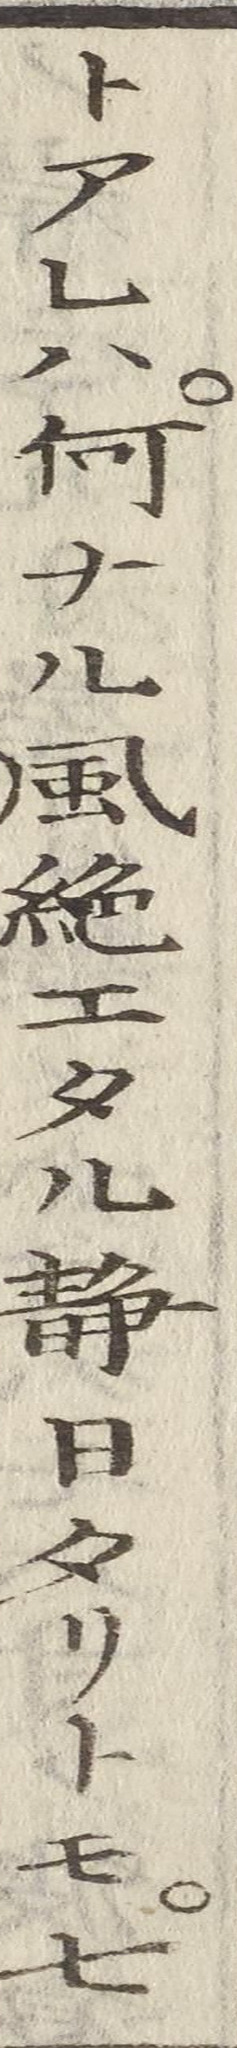トアレハ。何ナル風絶エタル静日タリトモ。七
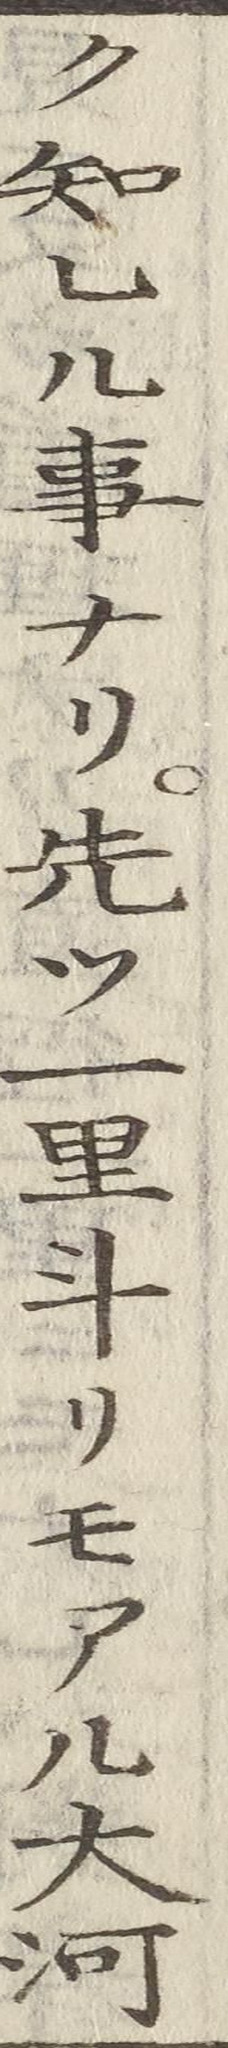ク知レル事ナリ。先ツ一里斗リモアル大河
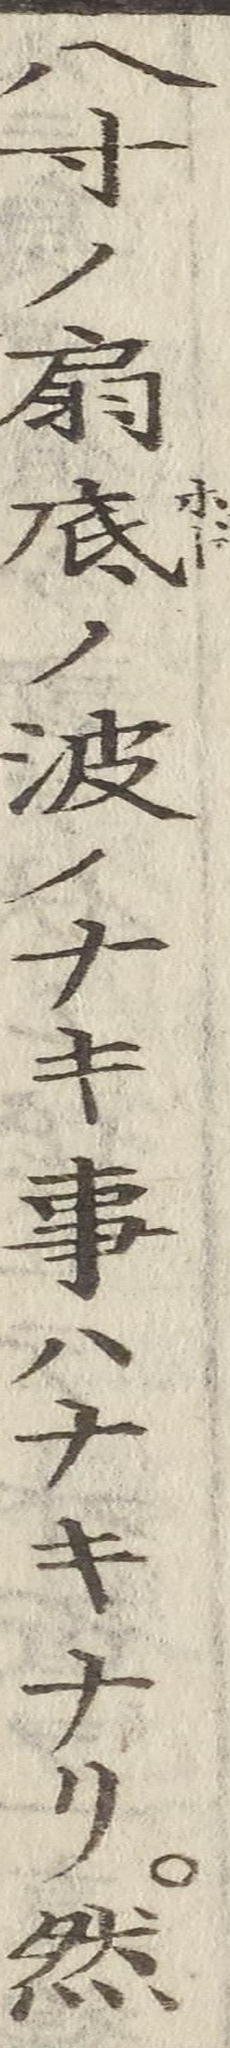八寸ノ扇底ノ波ノナキ事ハナキナリ。然

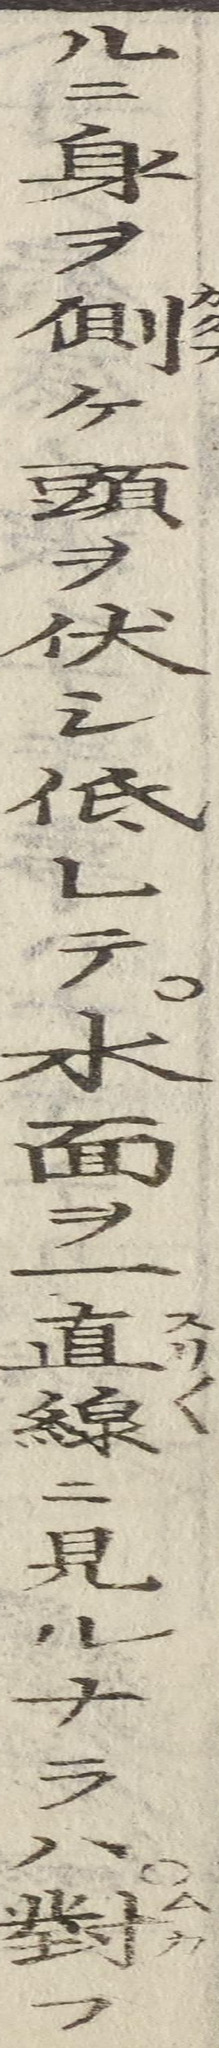ルニ身ヲ側ケ頭ヲ伏シ低レテ。水面ヲ一直線ニ見ルナラハ。対フ
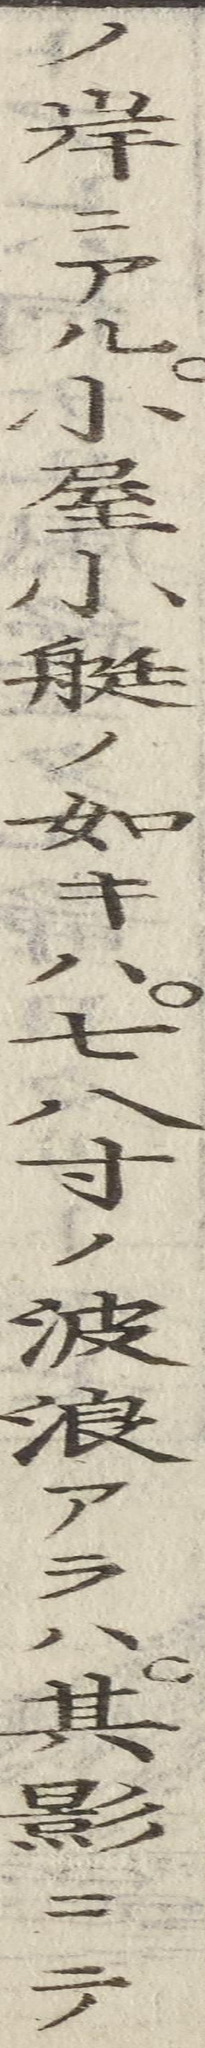ノ岸ニアル。小屋小艇ノ如キハ。七八寸ノ波浪アラハ。其影ニテ
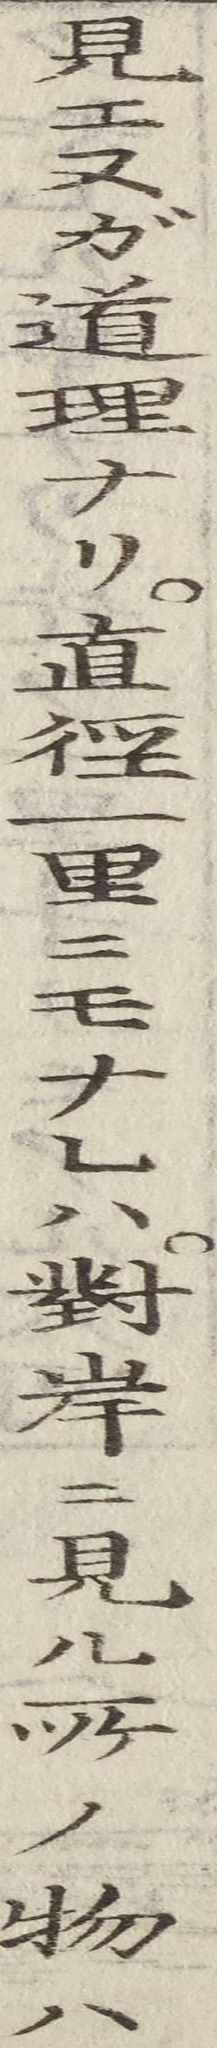見エヌガ道理ナリ。直径一里ニモナレハ。対岸ニ見ル所ノ物ハ
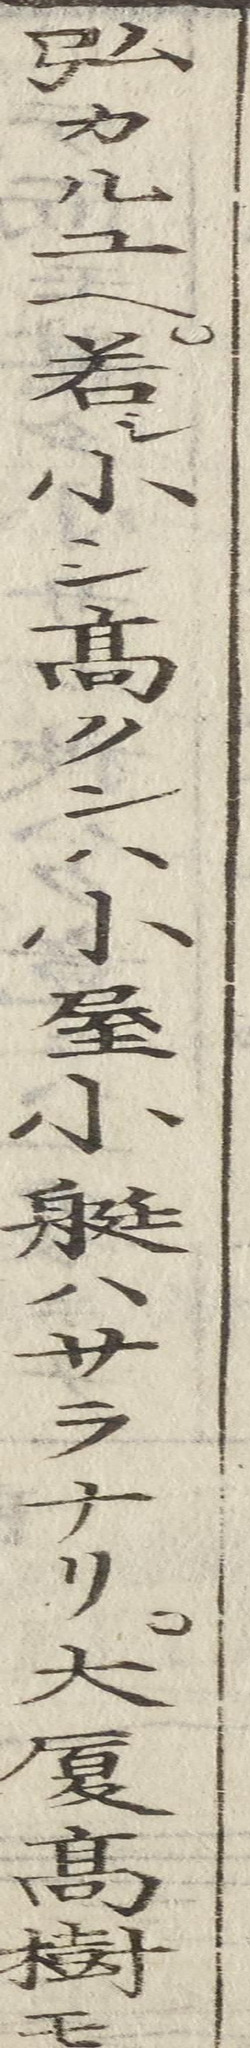弘カルユヘ。若小シ高クンハ小屋小艇ハサラナリ。大厦髙樹モ
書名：護法新論　中
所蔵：東京大学地震研究所図書室 Earthquake Research Institute Library, The University of Tokyo, JAPAN
